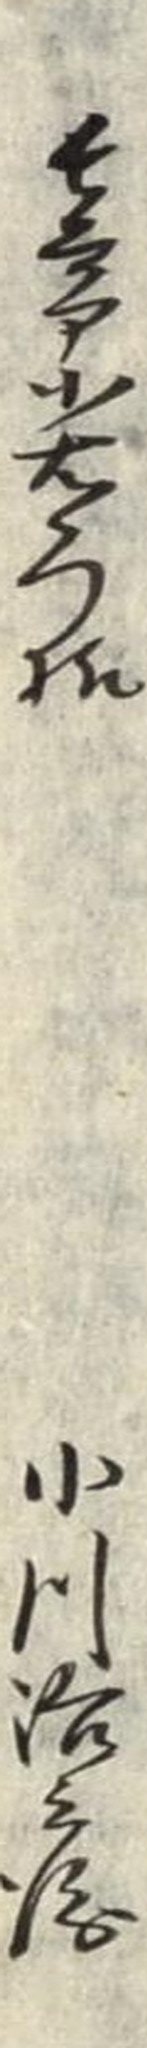二月長谷部小右衛門様小川治兵衛
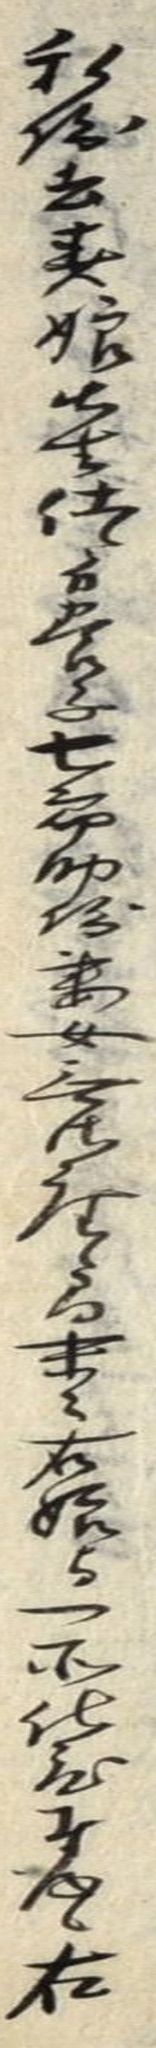私儀去春娘出生仕候ニ付養子七郎助儀妻女無御座候間末々右娘与一所仕度奉存候右

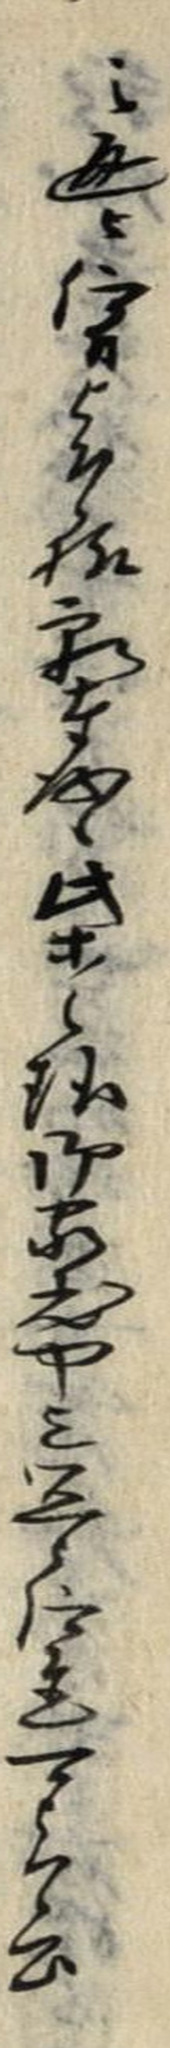之通被仰付被下候様願奉存候此等之趣御家老中迄宜被仰達可被下候以上
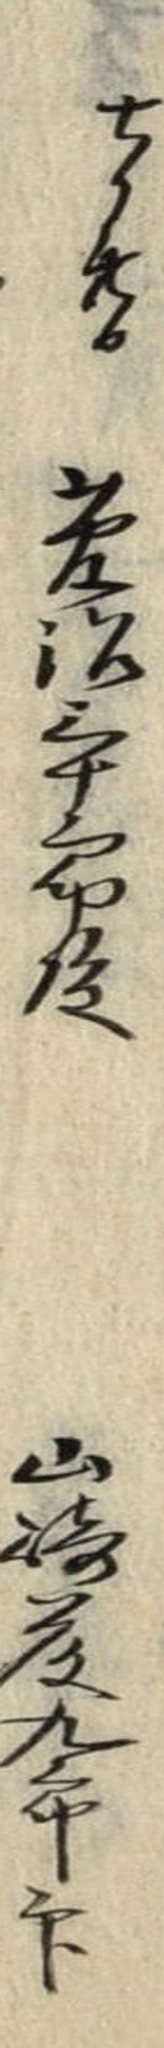七月廿日菅沼三十郎殿山崎藤九郎印
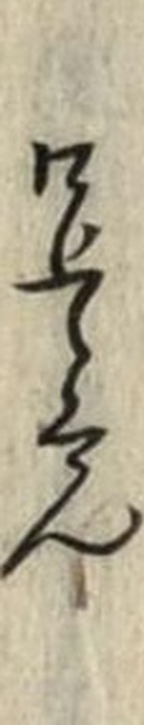口上之覚
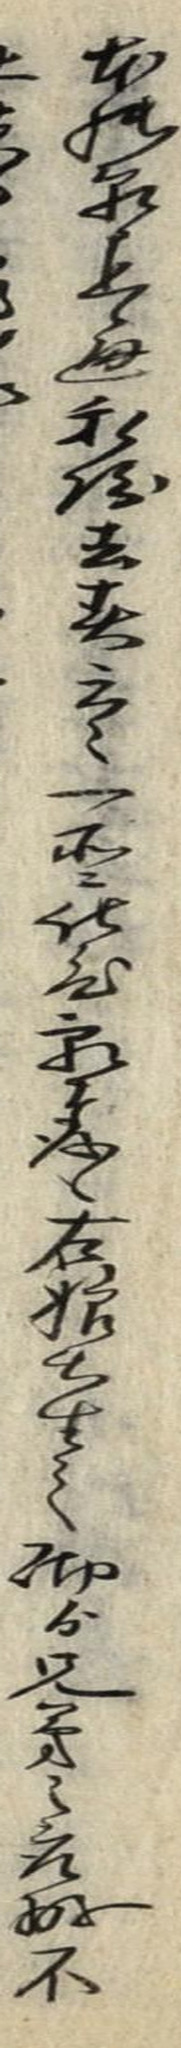本紙願申上候通私儀申春云々一所ニ仕度願奉存候右娘出生之砌ゟ兄弟之取扱不
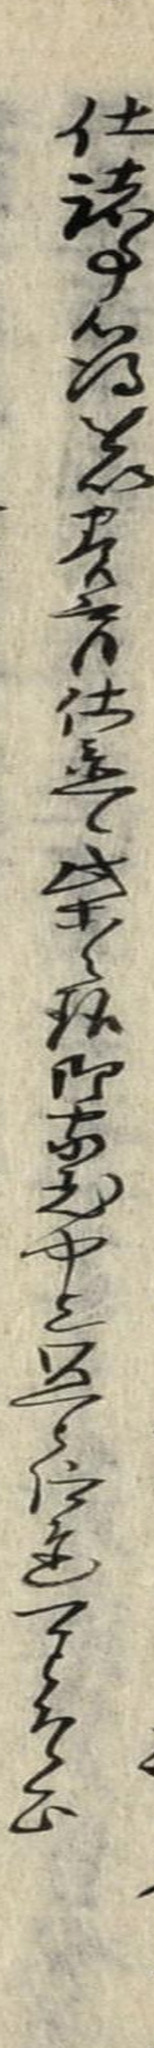仕諸事心得を以養育仕置候此等之趣御家老中迄宜被仰達可被下候以上
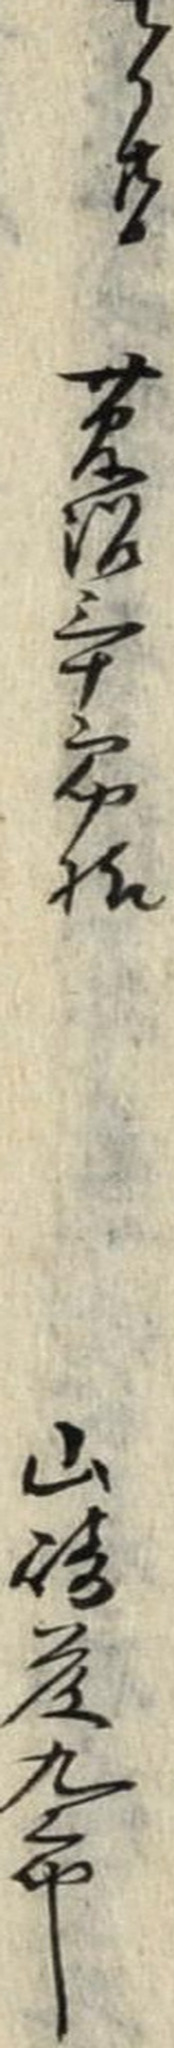七月廿日菅沼三十郎様山崎藤九郎
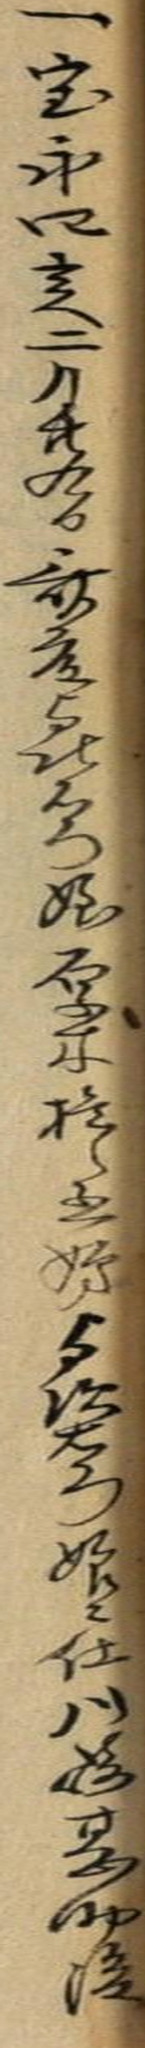一宝永四亥二月廿九日斎藤与次右衛門姪厚木権之丞姉与次右衛門娘ニ仕川崎甚助後
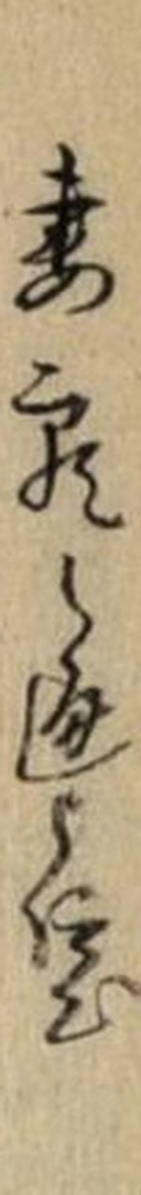妻願之通被仰出
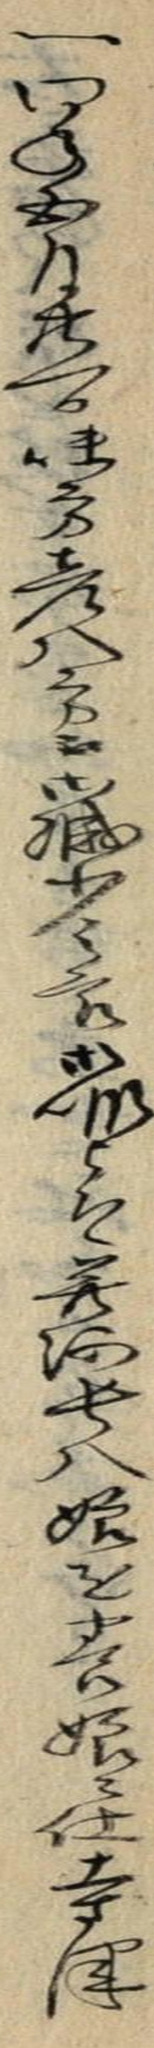一同年五月廿一日味方彦八方江御減少之節御暇被下并河長八娘を養娘ニ仕寺沢
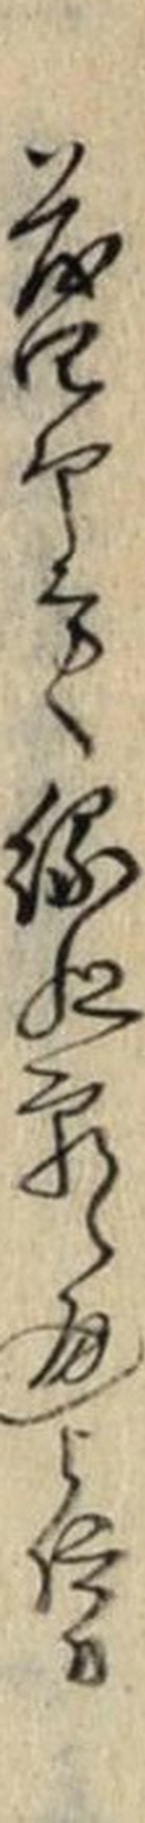茂四郎方へ縁組願之通被仰付
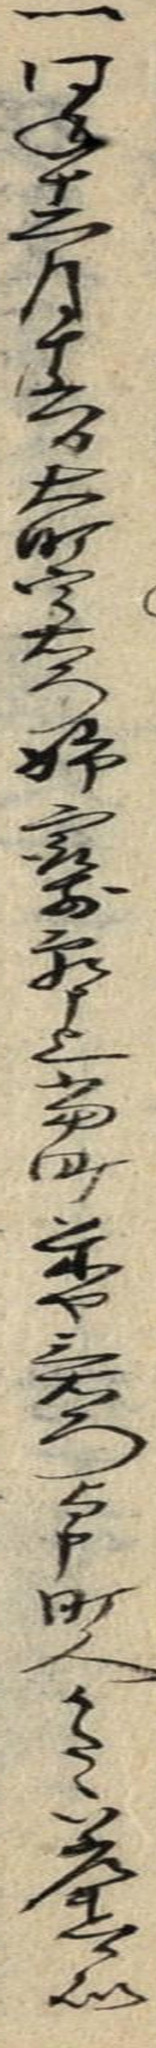一同年十二月十六日大町宇右衛門姉最前願申上当町米や三右衛門与申町人かたへ差遣候処
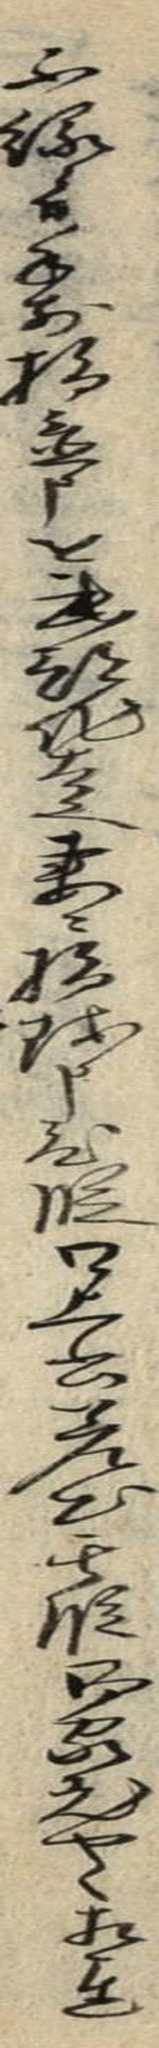不縁ニ付手前指置申を武部作太夫妻ニ指越申度段口上書差出其段御家老中へ相達
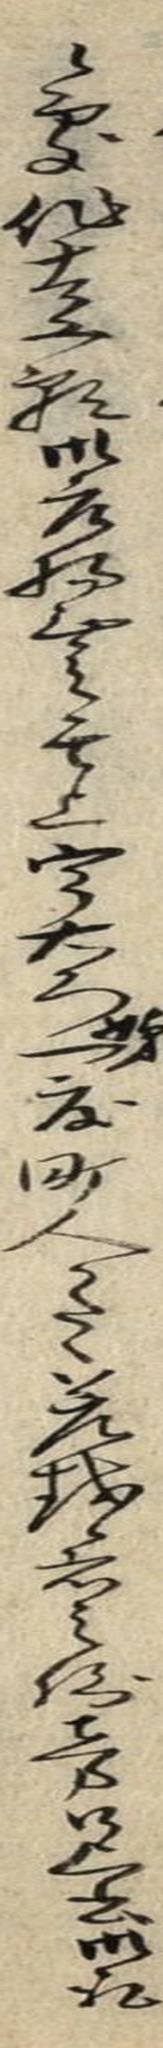候処作太夫願御取揚無之其上宇右衛門姉一度町人かたへ差越候者之儀旁口上書御取
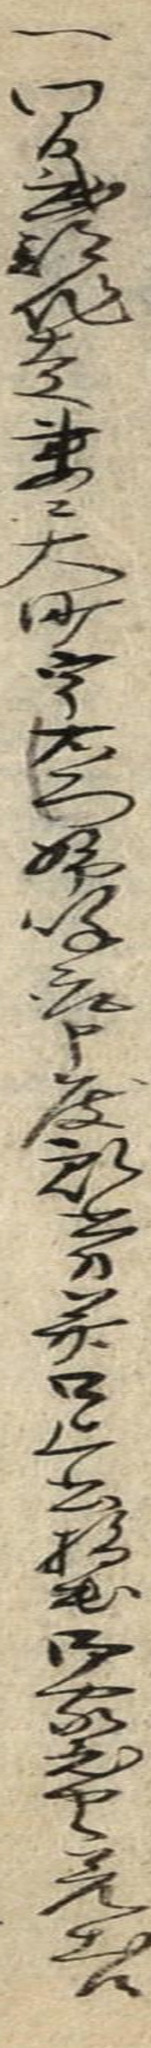一同日武部作太夫妻ニ大町宇右衛門姉呼取申度願書付并口上書指出御家老中へ差出候
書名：養子縁組之部
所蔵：福井県文書館 Fukui Prefectural Archives
